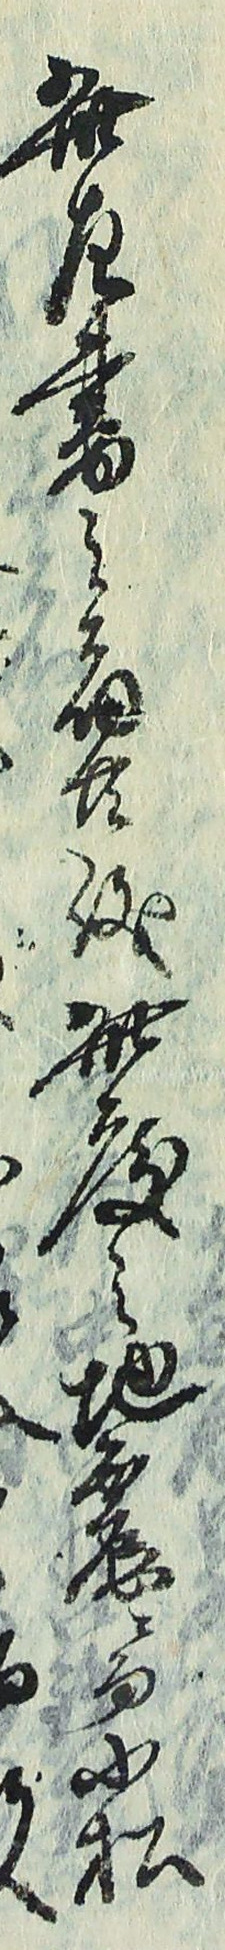此左書之者共儀此度之地震ニ而小松
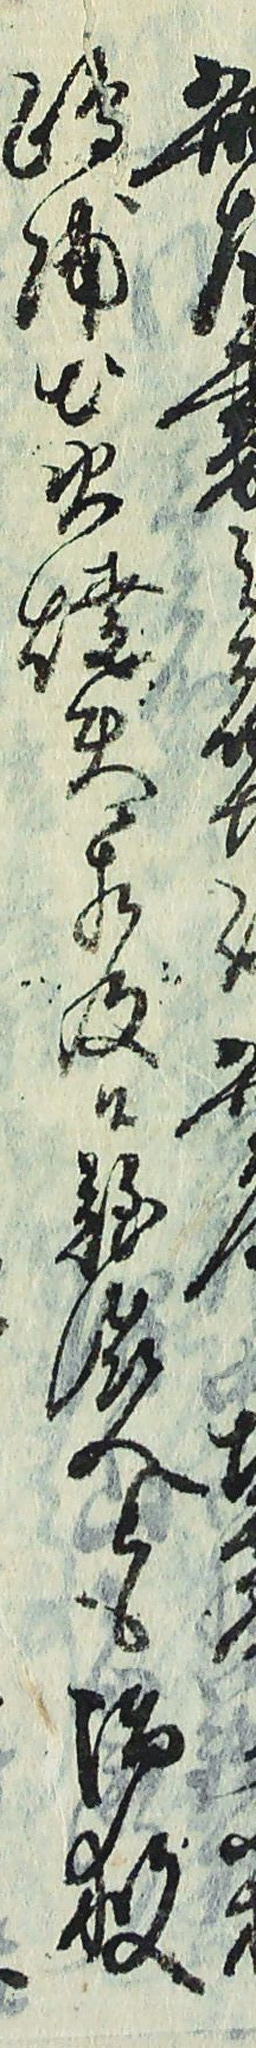嶋浦出火焼失ニ相及候難渋人とも御救
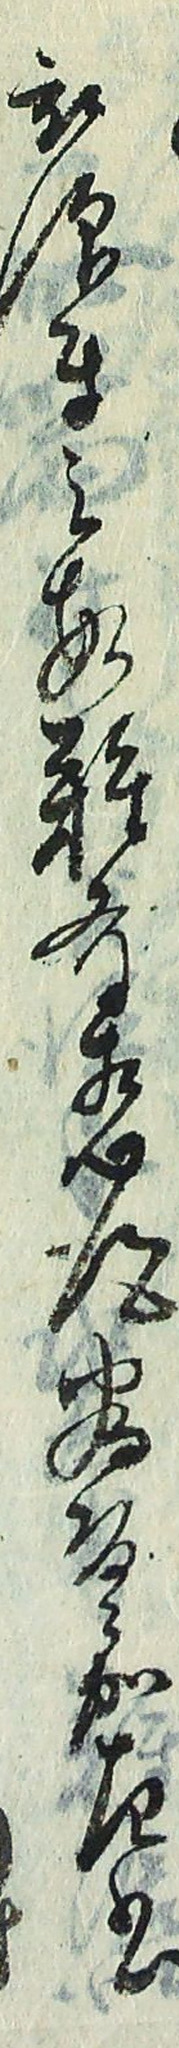被仰付之段難有相心得為冥加左書
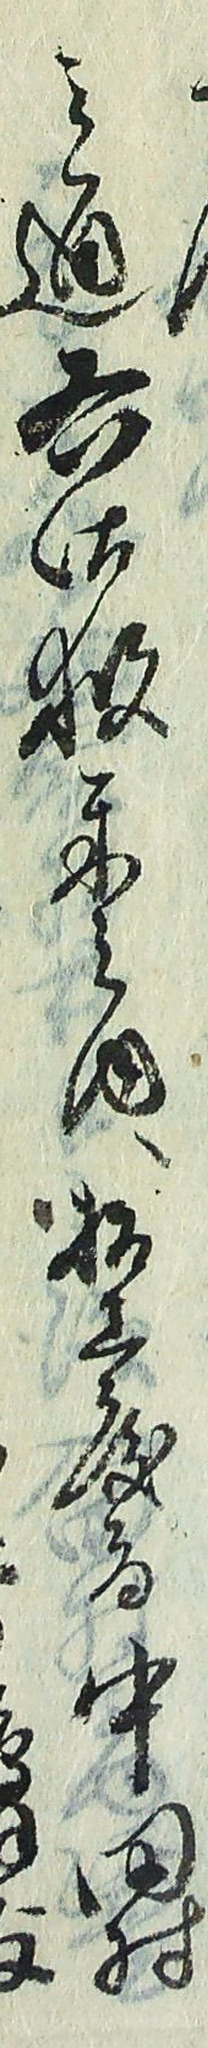之通右御救米之内へ指上度旨中田村
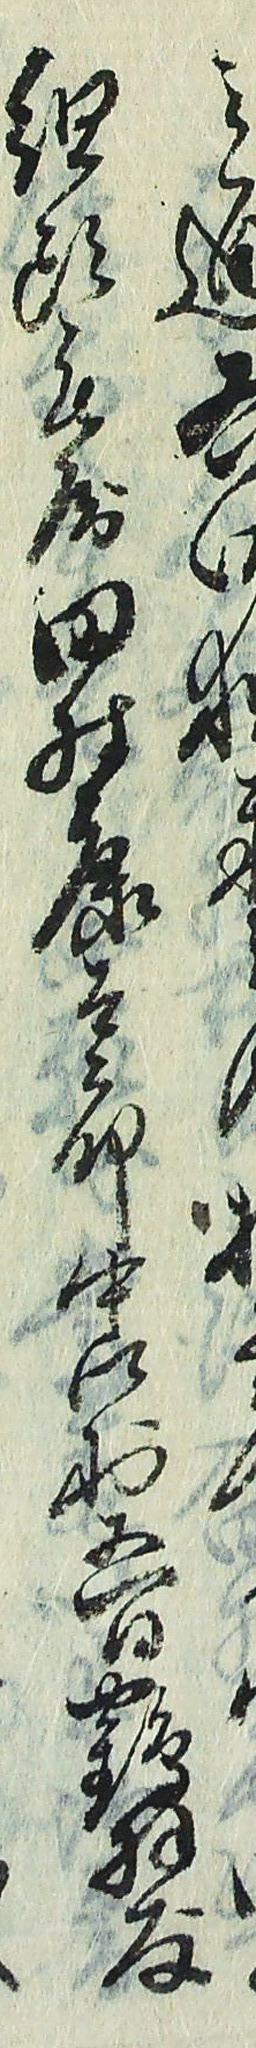組頭庄屋田村康太郎中郷村右同鶴羽友
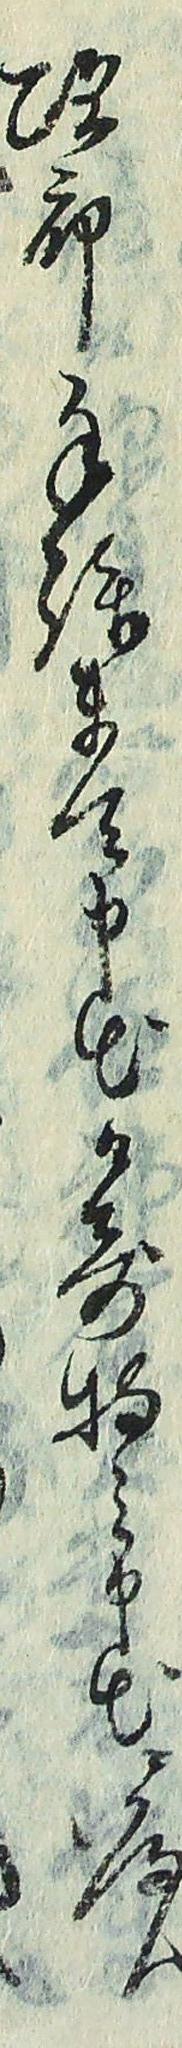次郎手許まて申出候寄持之申出ニ候得ハ
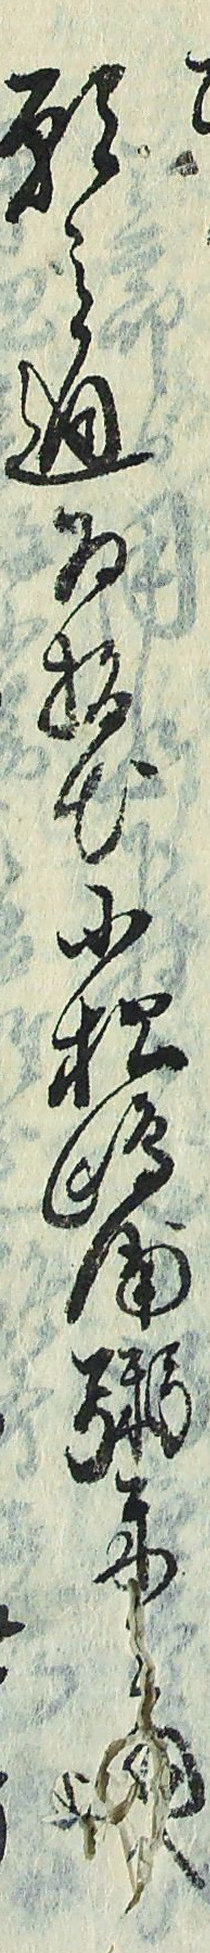願之通為指出小松嶋浦粥米之内へ
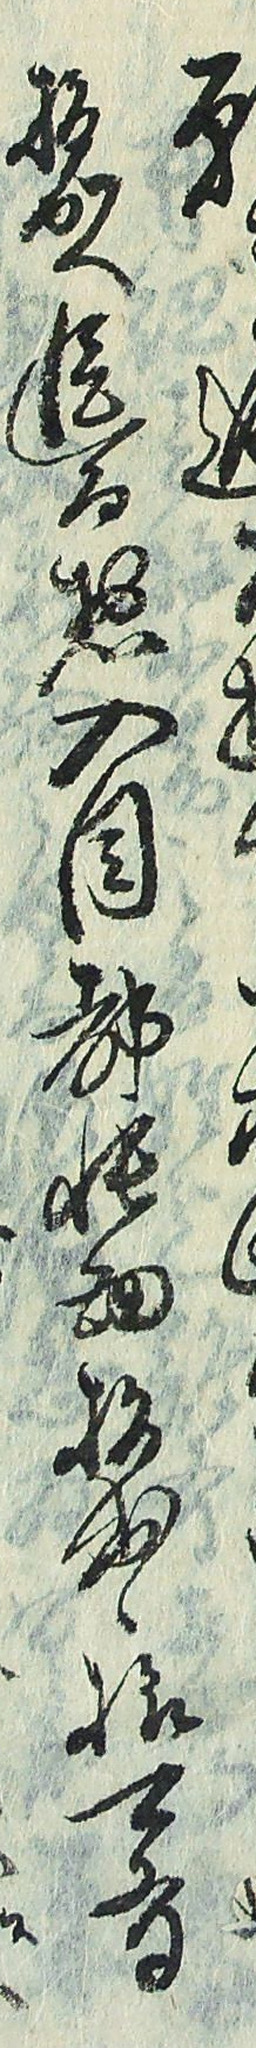指加へ追而惣入目都帳面指出候様可有
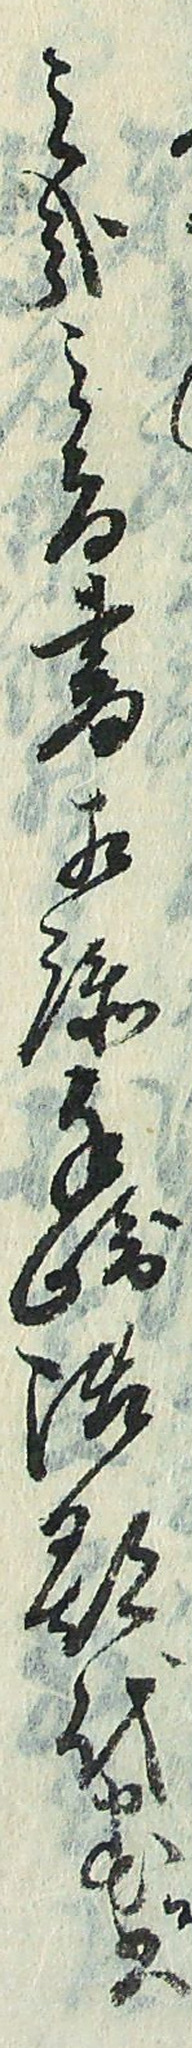之哉之旨書相添手崎御郡代申出候書

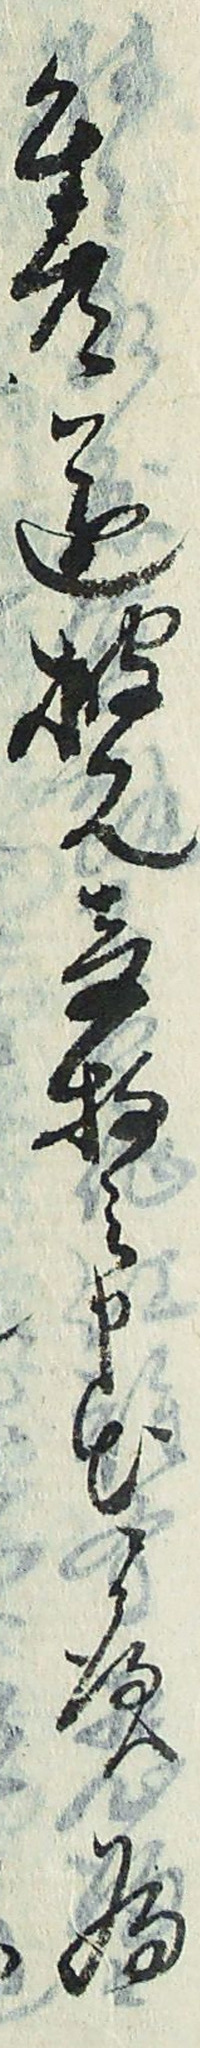付共遂披見壱牧之申出ニ候得ハ為
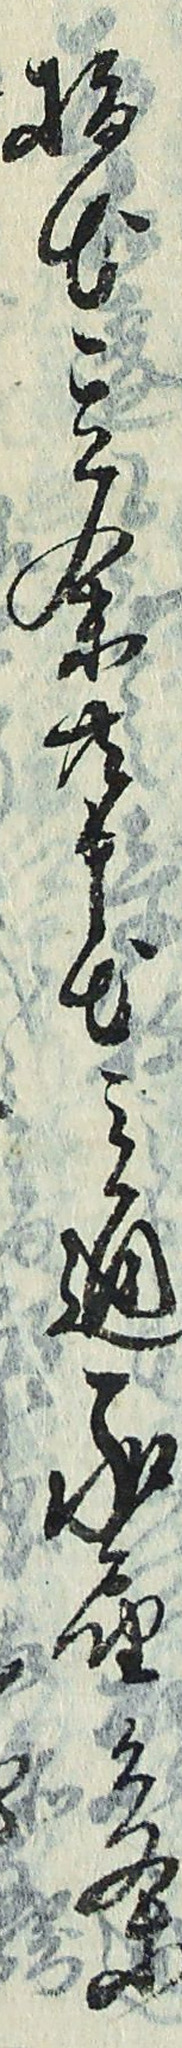指出其余共申出之通承届候条
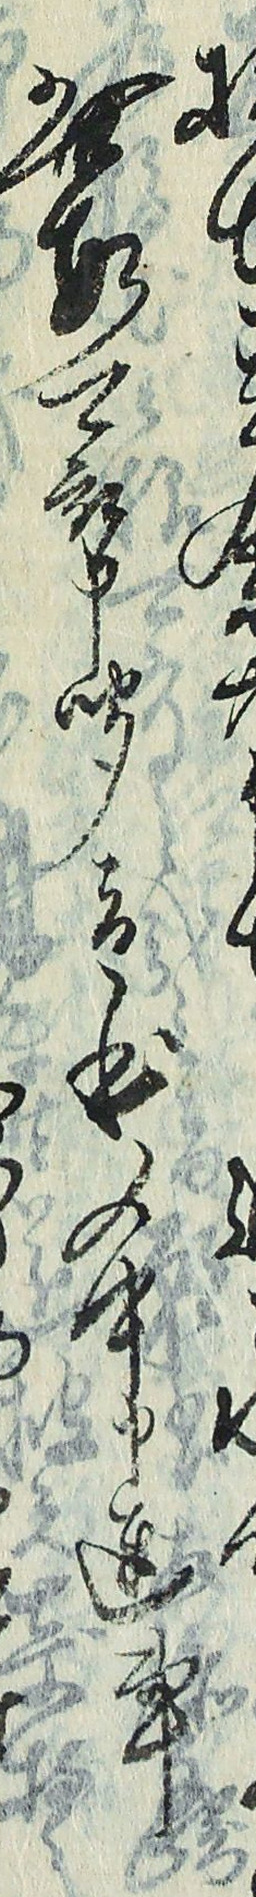此段可被申聞旨本〆中申達事
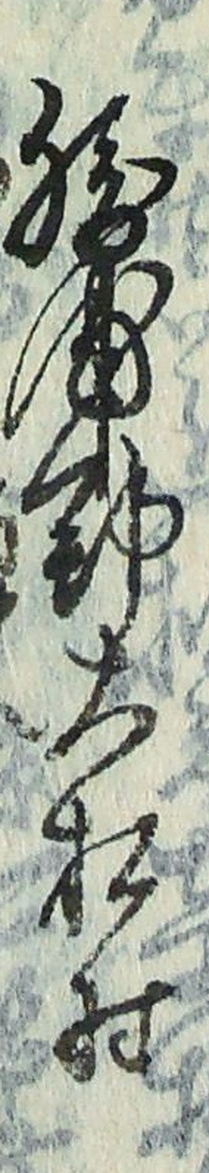勝浦郡大松村
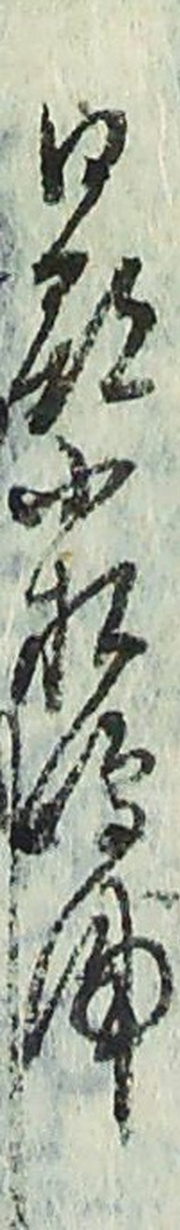同郡小松嶋浦
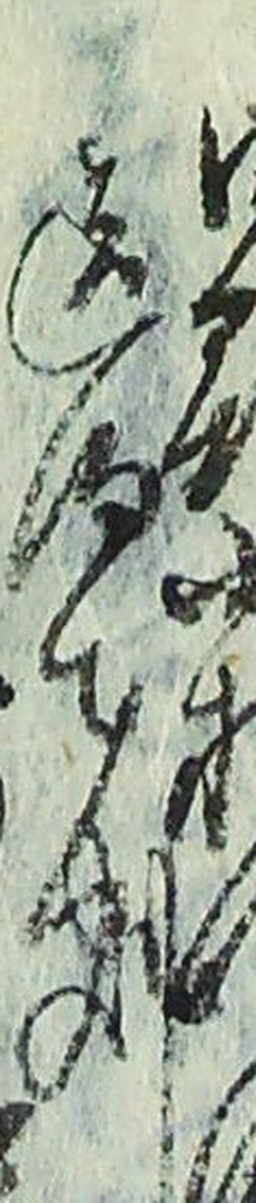造酒才判
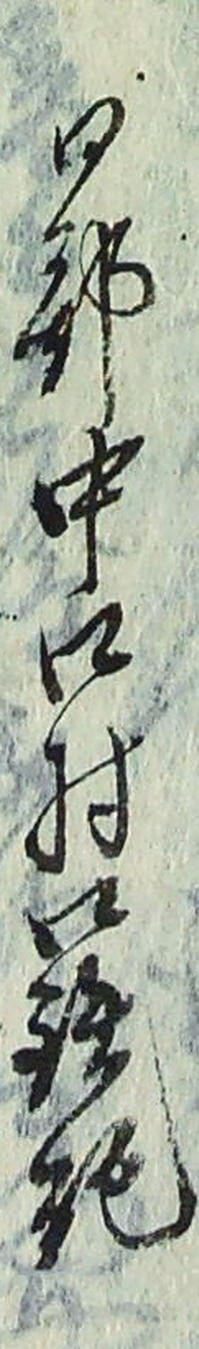同郡中郷村郷鉄砲
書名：諸御趣意書并御下知向之写
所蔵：鳴門教育大学 Naruto University of Education
